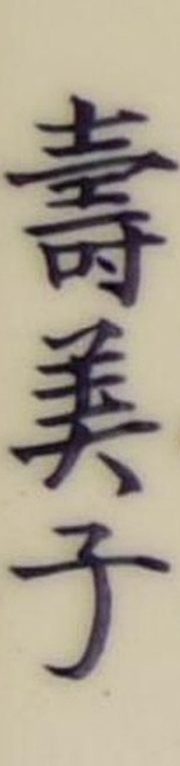壽美子

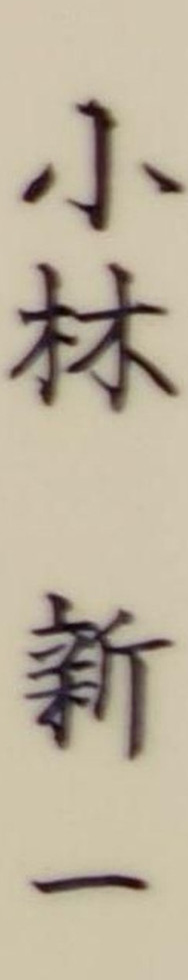小林新一
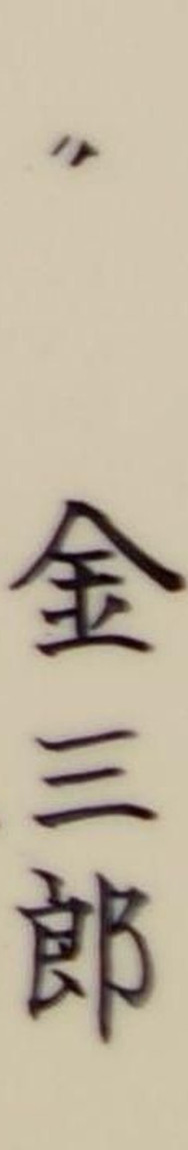金三郎
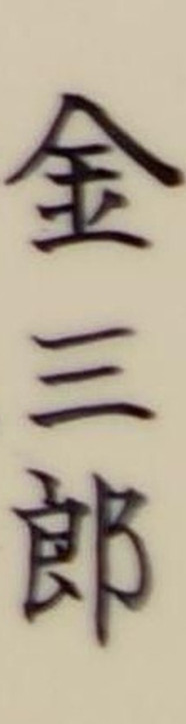金三郎
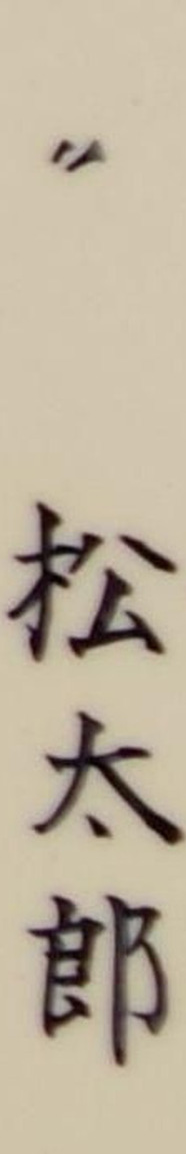松太郎
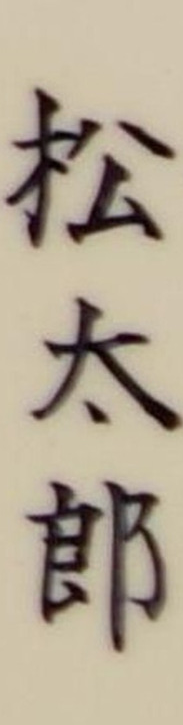松太郎
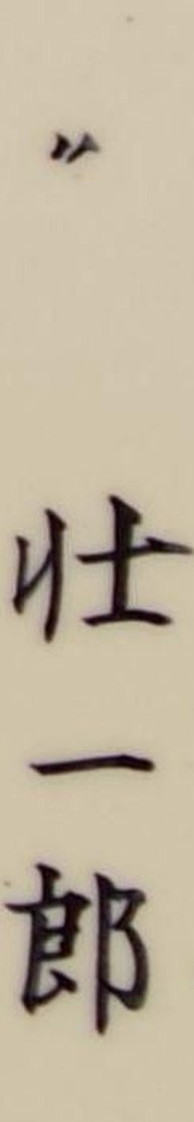壮一郎
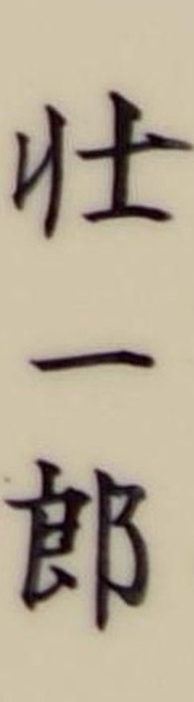壮一郎
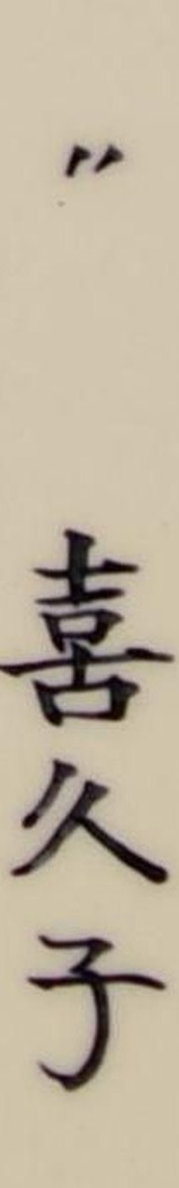喜久子
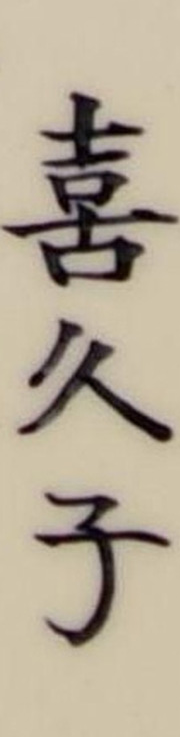喜久子
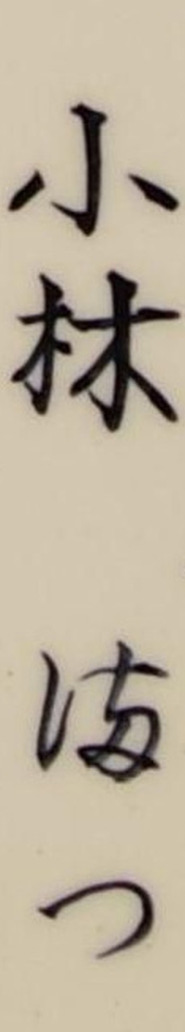小林まつ
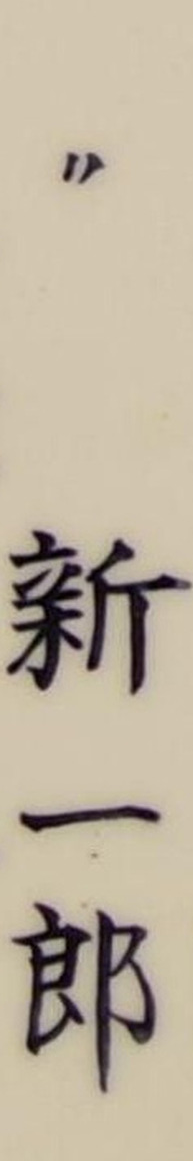新一郎
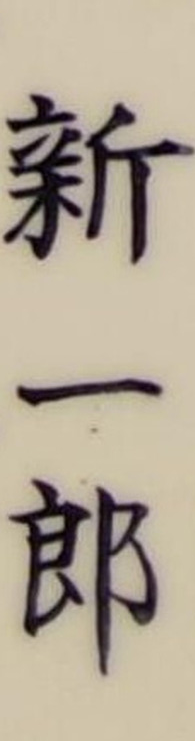新一郎
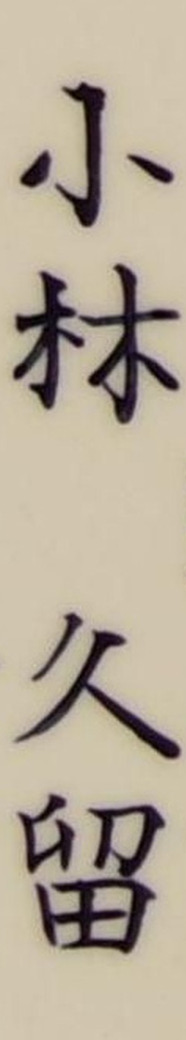小林久留
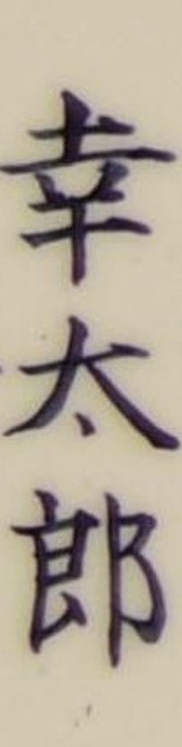幸太郎

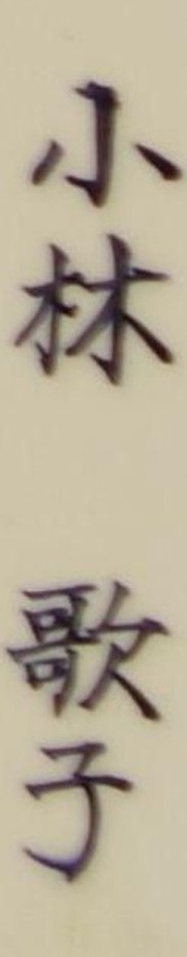小林歌子
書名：A~D
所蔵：koyasan kongobuji
